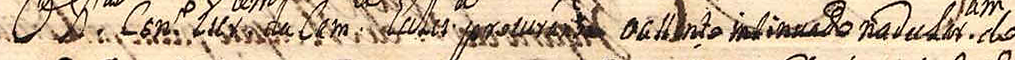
O R.do Con.so Escr.vam da Cam.a Eccles.a procurad_ o assento indicado na declar.am do
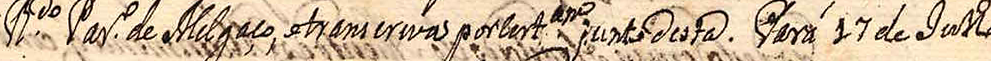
R.do Par.o de Melgaço e transcrevos por cert.am junto desta. Pará 17 de Iulho
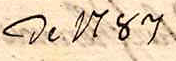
de 1787
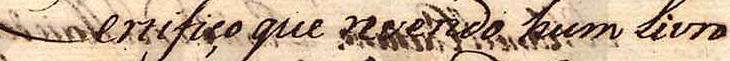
Certifiço que revendo hum livro
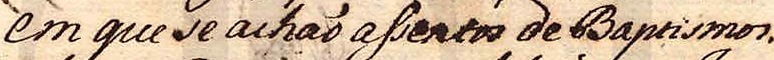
em que se achaõ assentos de Baptismos,
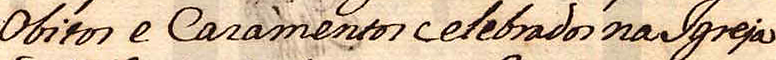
Obitos e Cazamentos celebrados na Jgreja
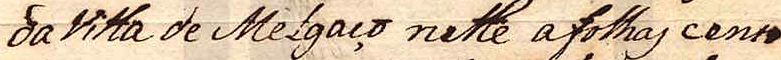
da Villa de Melgaço nelle a folhas cento
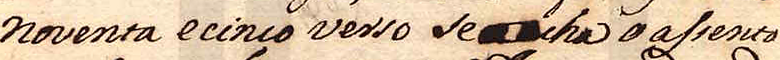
noventa e cinco verso se a acha o assento
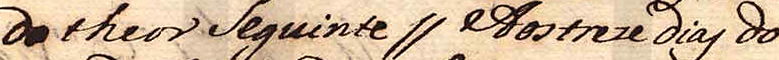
do theor Seguinte // Aos treze dias do
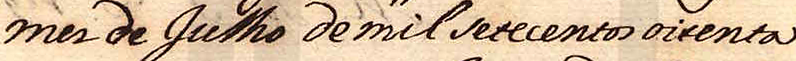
mes de Julho de mil setecentos oitenta
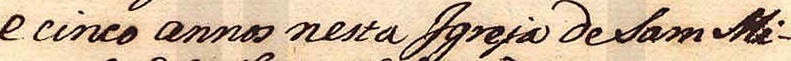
e cinco annos nesta Igreja de Sam Mi
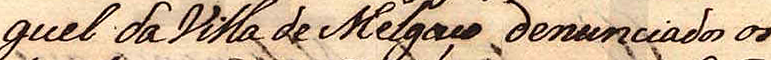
guel da Villa de Melgaço denunciados os
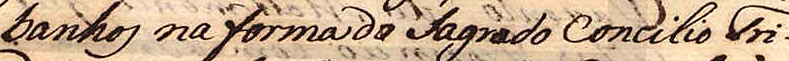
banhos na forma do Sagrado Concilio Tri
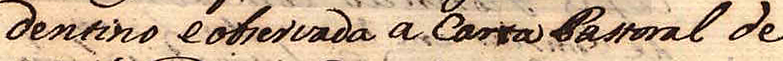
dentino e observada a Carta Pastoral de
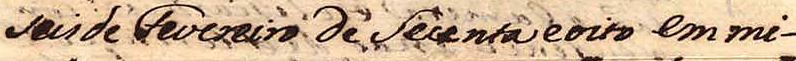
seis de Fevereiro de Secenta e oito em mi
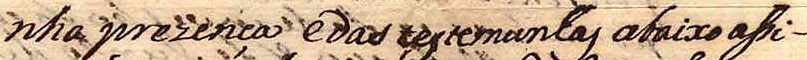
nha prezença e das testemunhas abaixo assi
